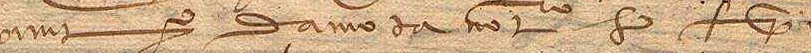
amto da mota notro ho sp̄uy
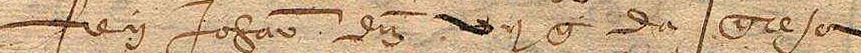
item frey Johaõ diz vygro da JgreJa
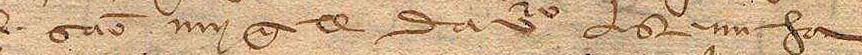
de saõ mygell davro testemunha
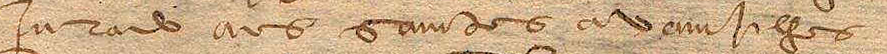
Jurado aos samtos avamgelhos
